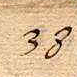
38
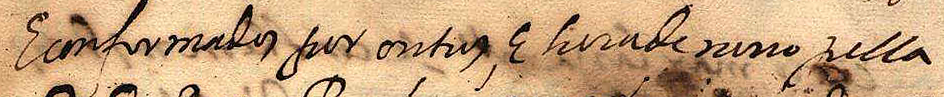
E conformados por outros, E hera de nouo pella
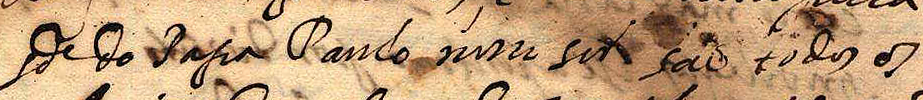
jde do Papa Paulo nom ser são todos os
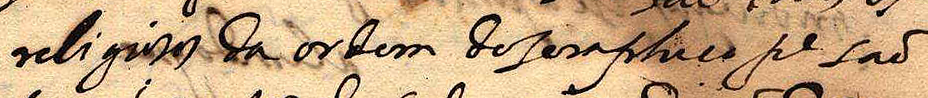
religiozos da ordem de serapluco pe saõ
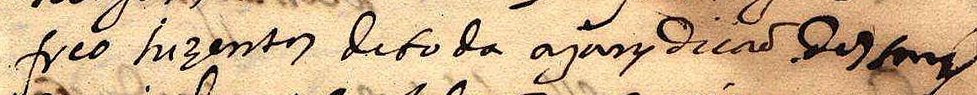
frco Inzentos de toda a jurisdiçaõ dos snres
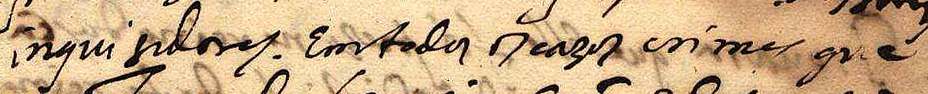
inquisidores. Em todos os cazos crimes que
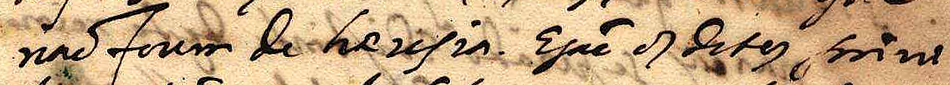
naõ forem de heresia. E saõ os ditos priui
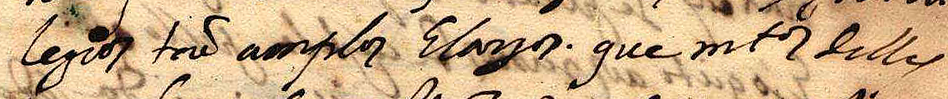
legios taõ amplos E largos. que mtos delles
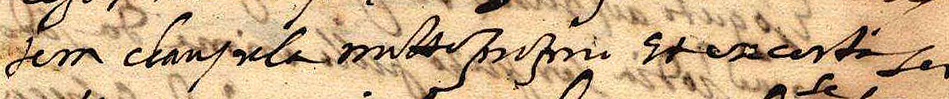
tem clausula molto proprio E tem certa sci
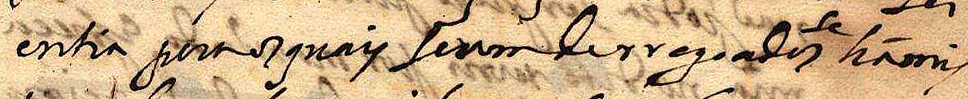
entia pera os quais seam derrogoados se hā mis
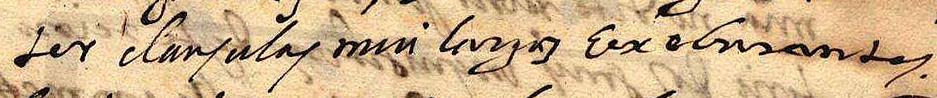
ter clausulas mui largas E exeburantes.
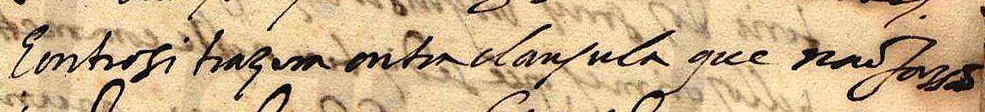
E outrosi trazem outra clausula que naõ faz
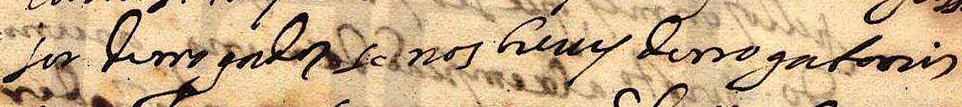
ser derrogados se nos liures derrogatorios
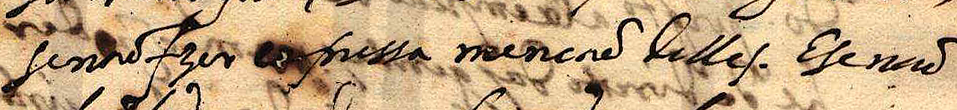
se naõ fzer _ pressa mençaõ delles. E se naõ
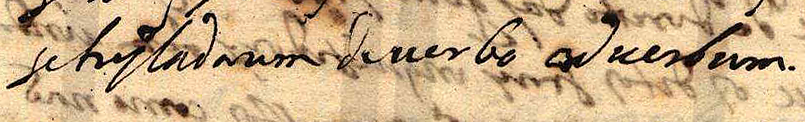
se tresladarem de uerbo ad uerbum.
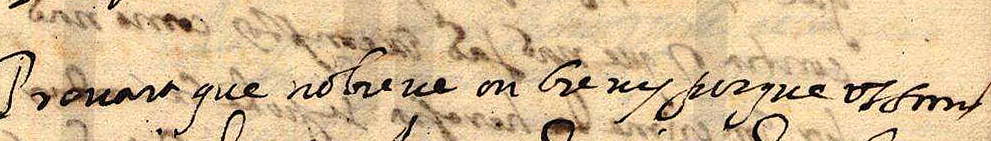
Prouara que no breue ou breues porque os snres̄
